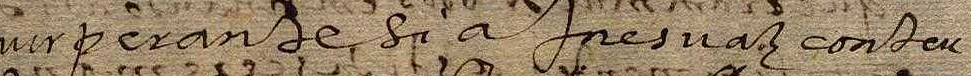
uir perante si a Jnes uaz conteu
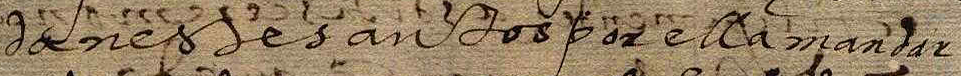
da nestes autos por ella mandar
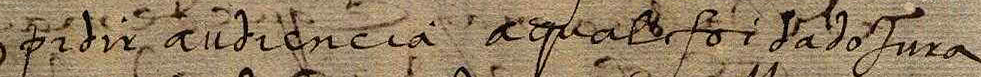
pidir audiencia a qual foi dado Jura
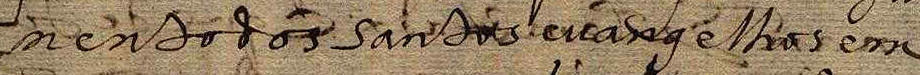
nento dos santos euangelhos em
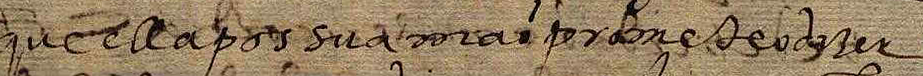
que ella pos sua maõ prometeo dizer
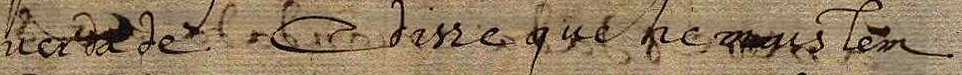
uerdade e disse que he mais lem
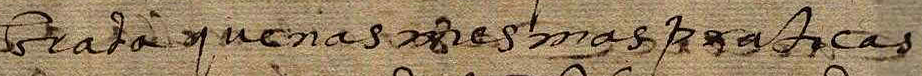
brada que nas mesmas praticas
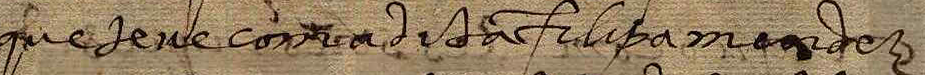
que teue com a dita filipa mendez
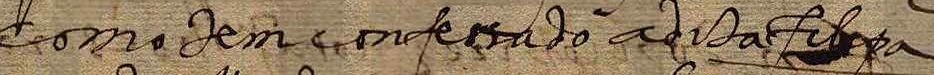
como tem confessado a dita filipa
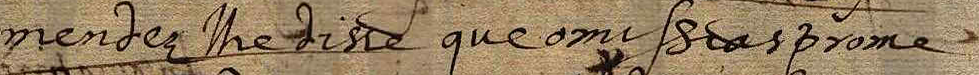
mendez lhe disse que o missias prome
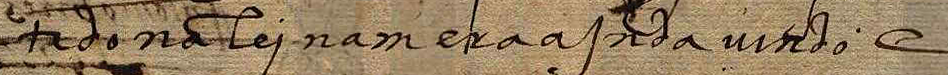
tido na lej nam era ajnda uindo e
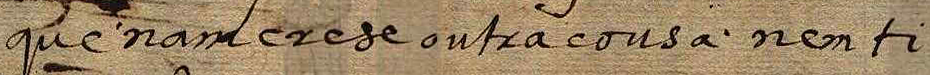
que nam crese outra cousa nem ti
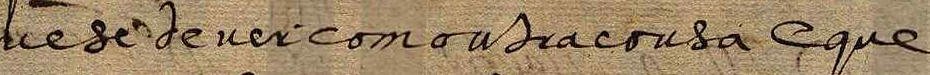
uese deuer com outra cousa e que
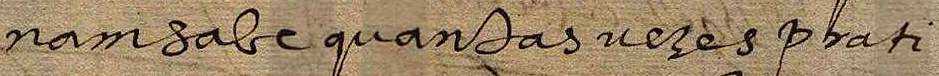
nam sabe quantas uezes prati
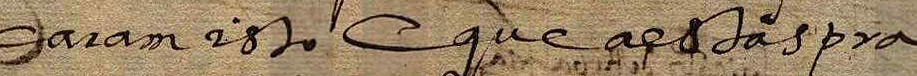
caram isto e que a estas pra
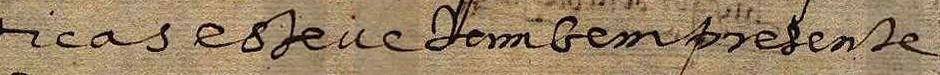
ticas esteue tambem presente
